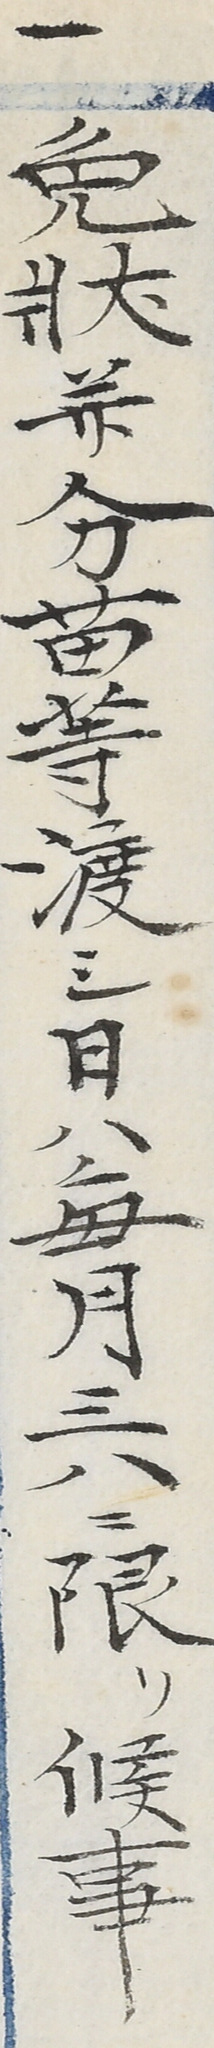一免状幷分苗等渡シ日ハ毎月三八ニ限リ候事
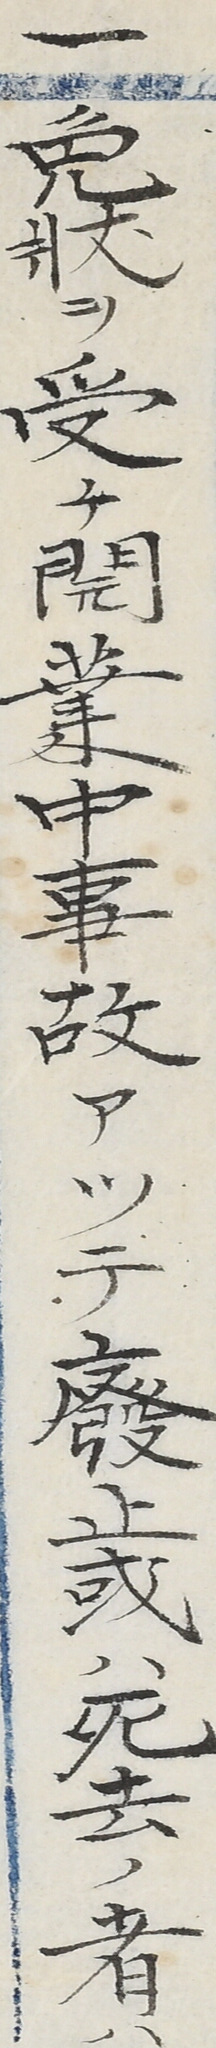一免状ヲ受テ開業中事故アツテ廃止或ハ死去ノ者ハ
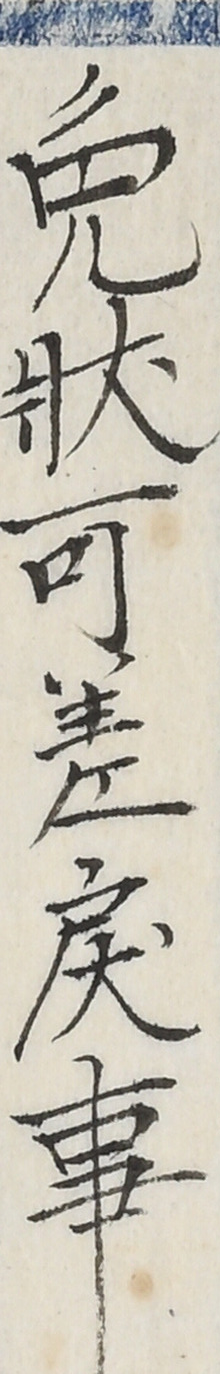免状可差戻事
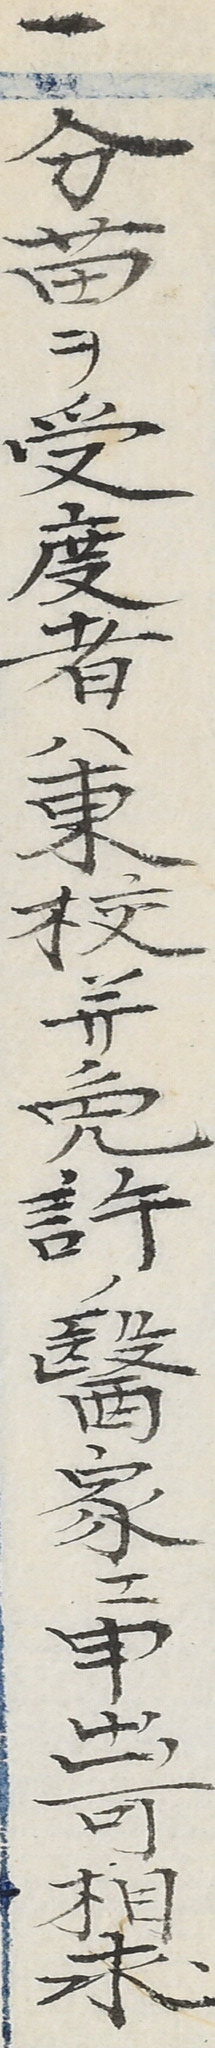一分苗ヲ受度者ハ東校幷免許ノ医家エ申出可相求
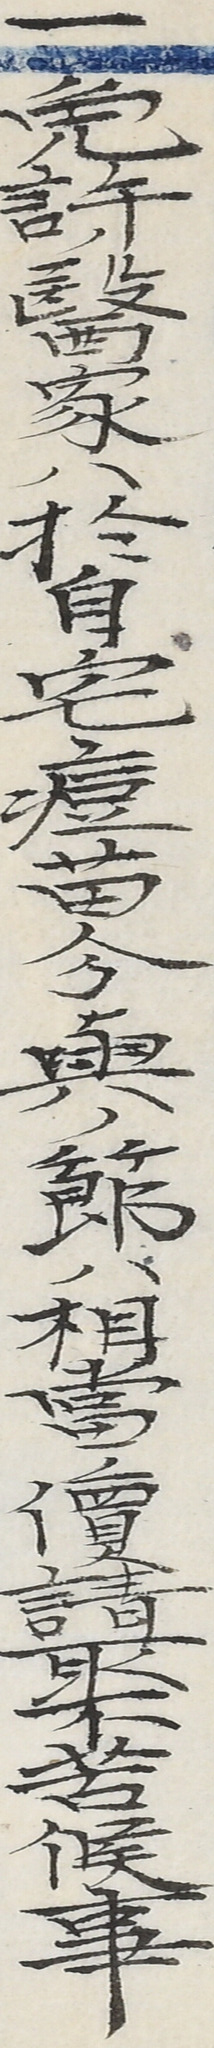一免許医家ハ於自宅痘苗分与ノ節ハ相当ノ価請取不苦候事
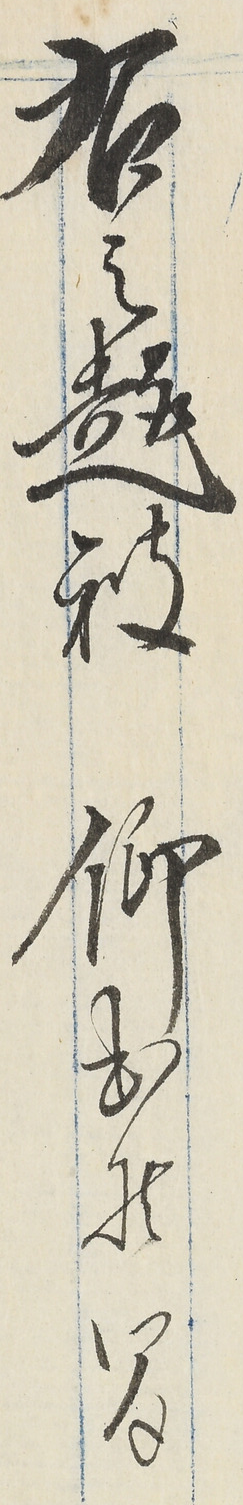右之趣被仰出候間
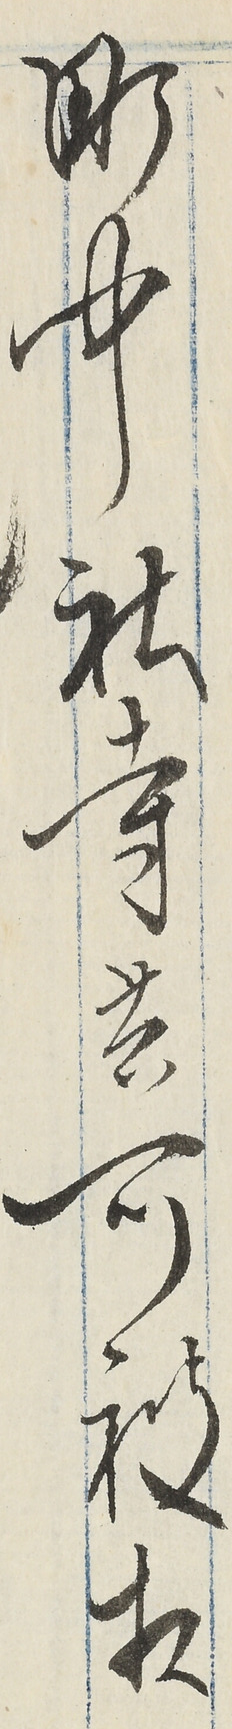町中社寺共可被相
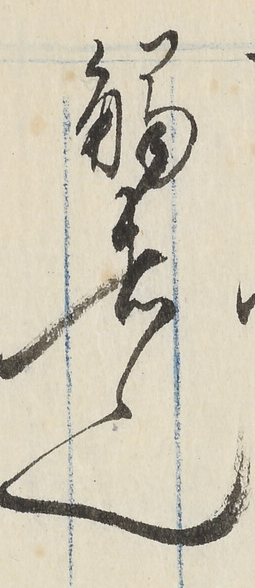触者也
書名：布達書留
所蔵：伊那市立高遠町図書館・合同会社AMANE
